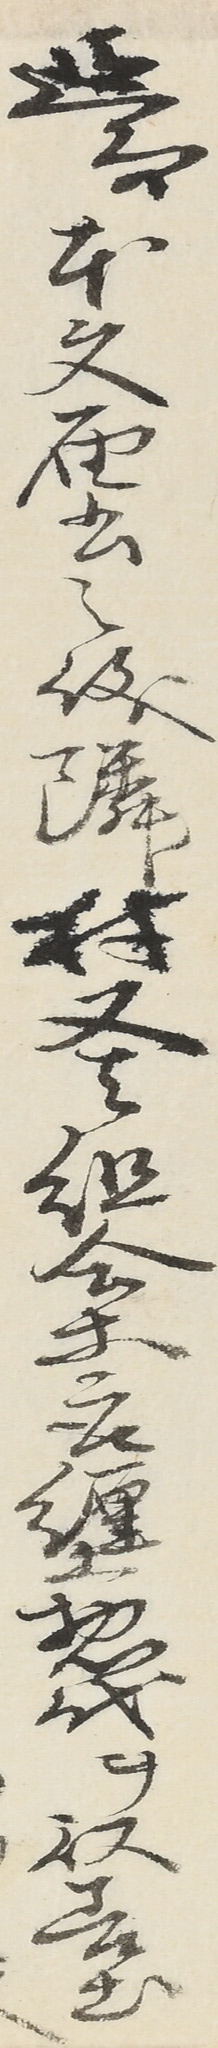追而本文届書之儀隣村又者組合等取纏惣代ヲ以差出
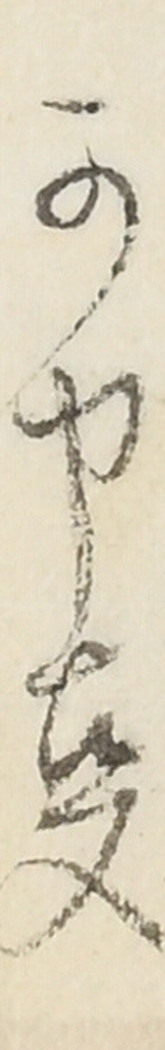可申事

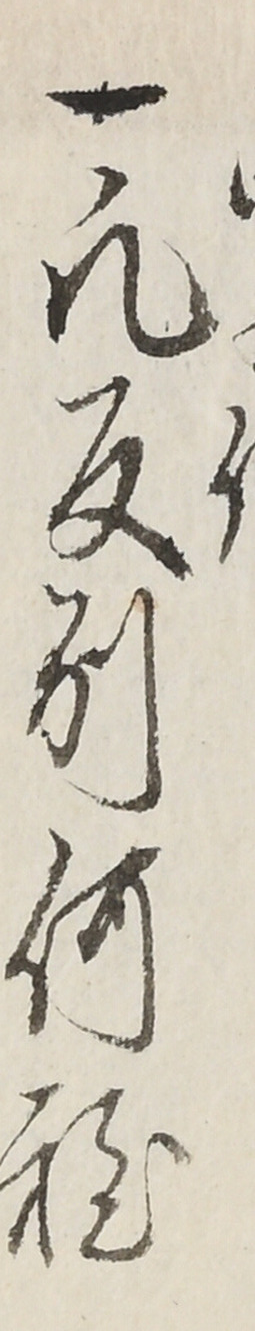一凡反別何程
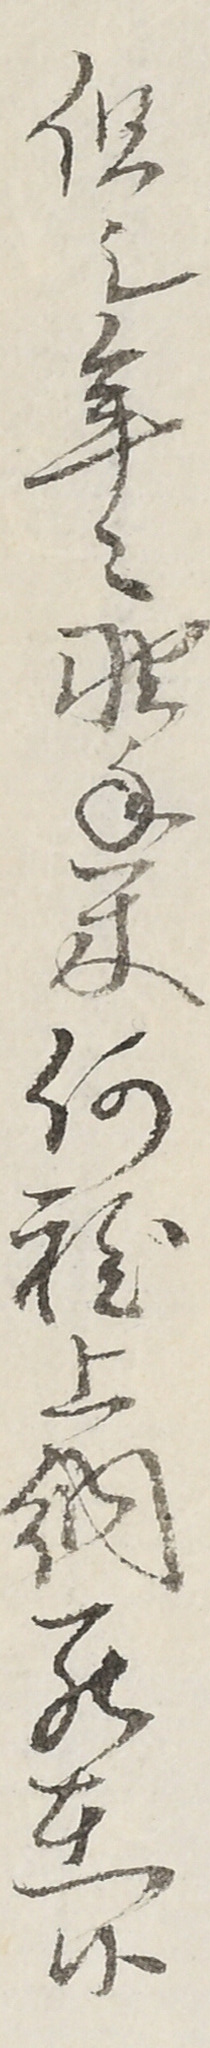但シ年々野手米何程上納罷在候
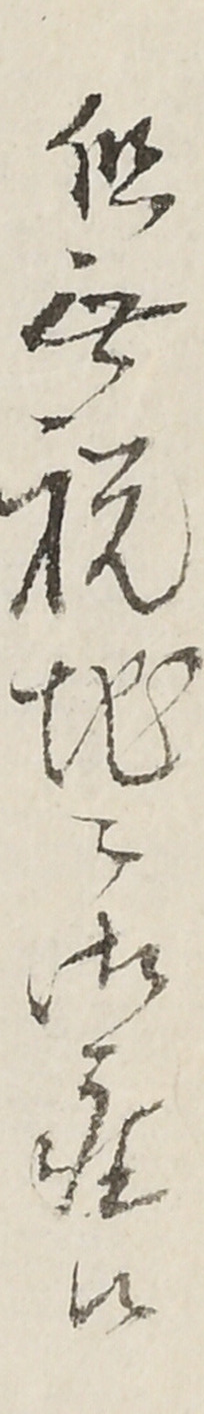但無祝地ニ御座候
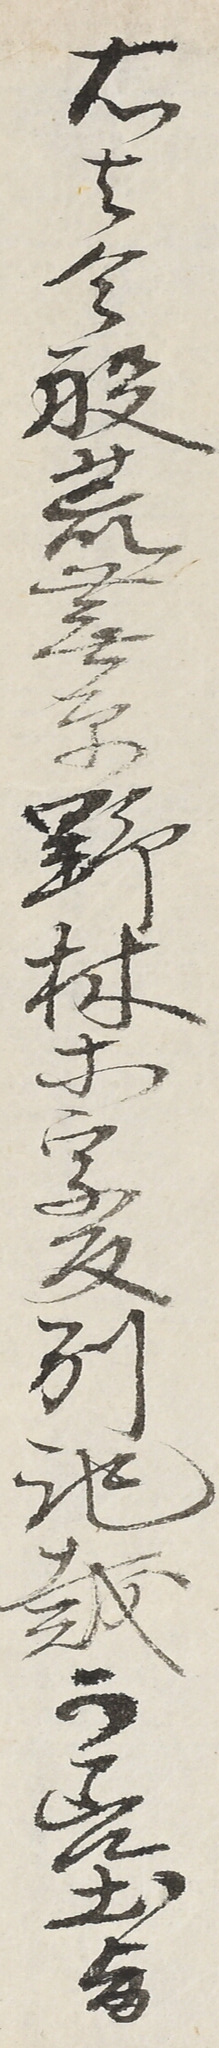右者今般荒蕪原野林等字反別記載可差出旨
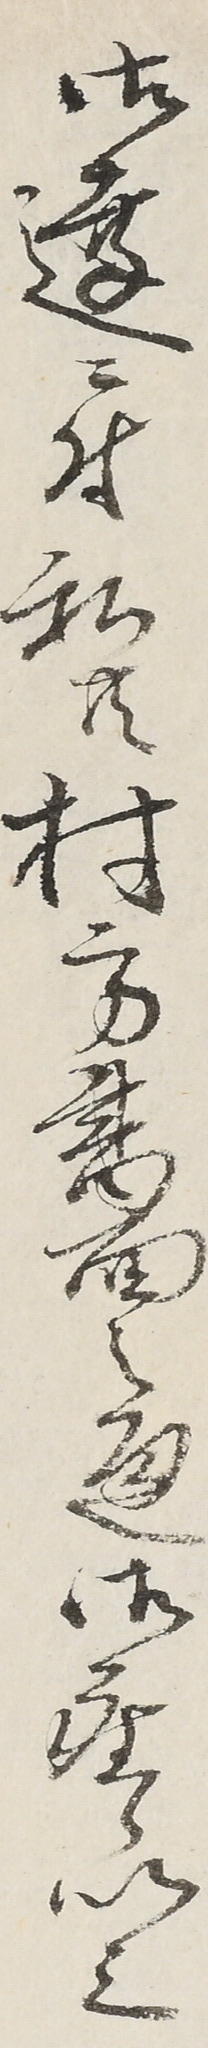御達ニ付私共村方書面之通御座候以上
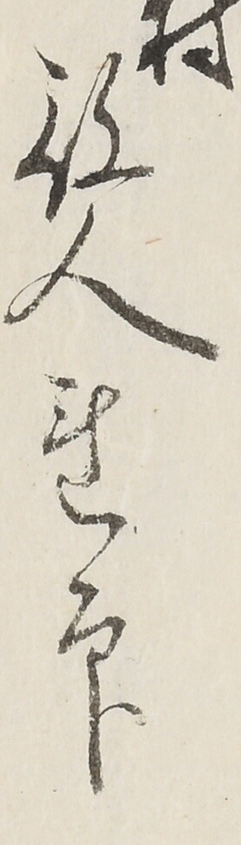役人連印
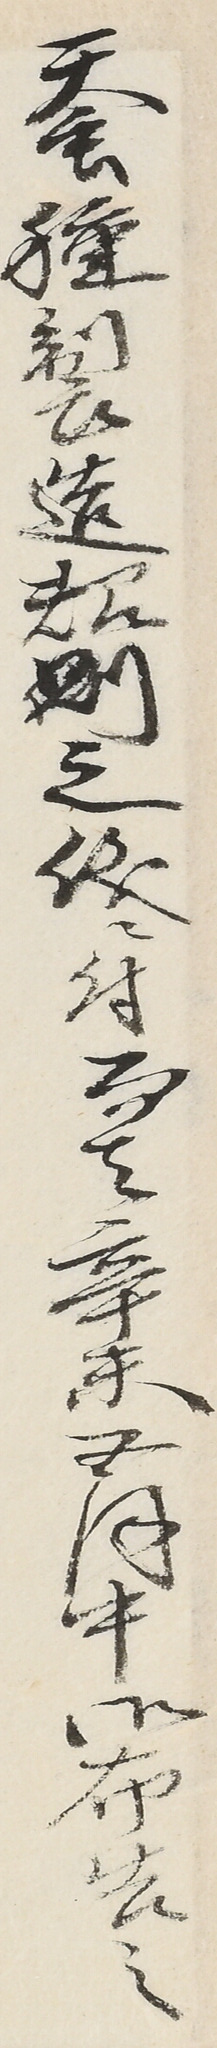蚕種製造規則之儀ニ付而者辛未五月中御布告之
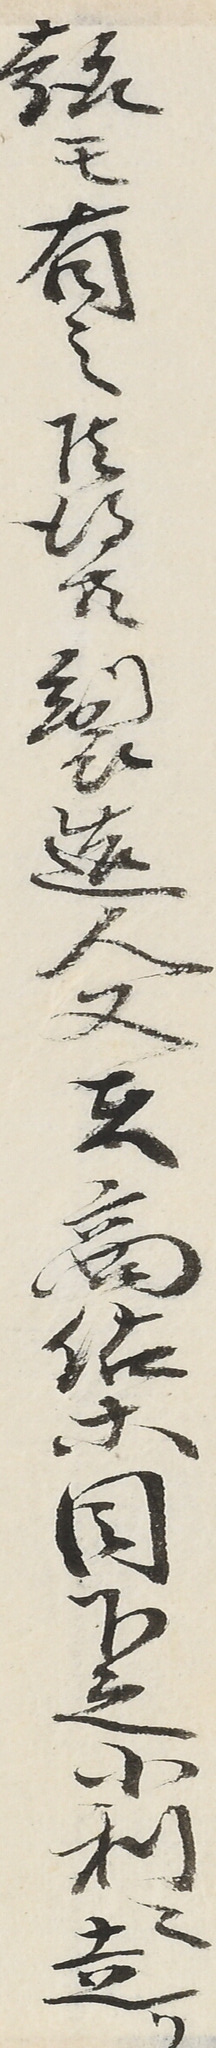趣モ有之候得共製造人又者商估等目下之小利ニ走り
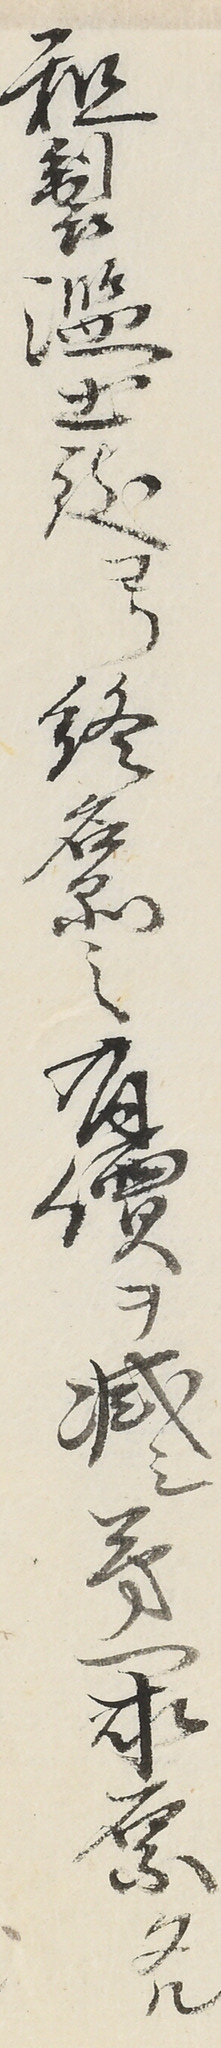粗製濫土致ヨリ終名品有価ヲ減シ第一求タル
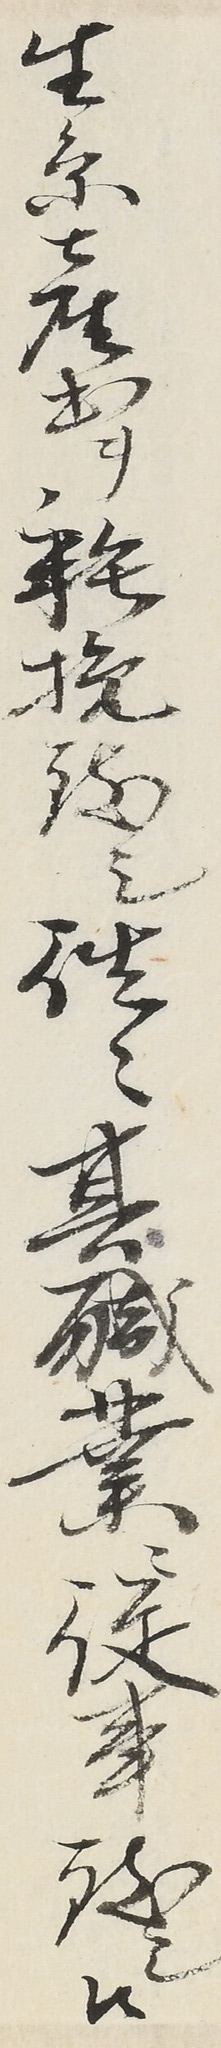生糸算出ヲ挽致シ往々其職業ニ従事致シ候
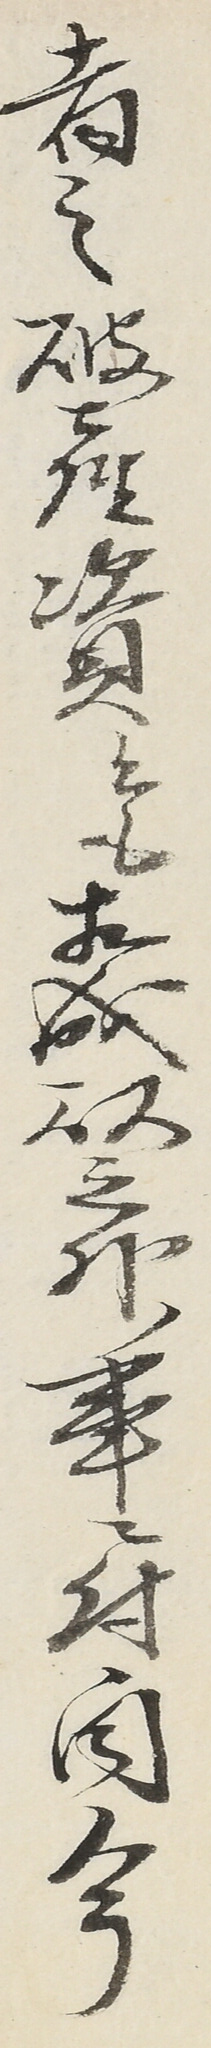者之破産資とも相成以之外ノ事ニ付自今
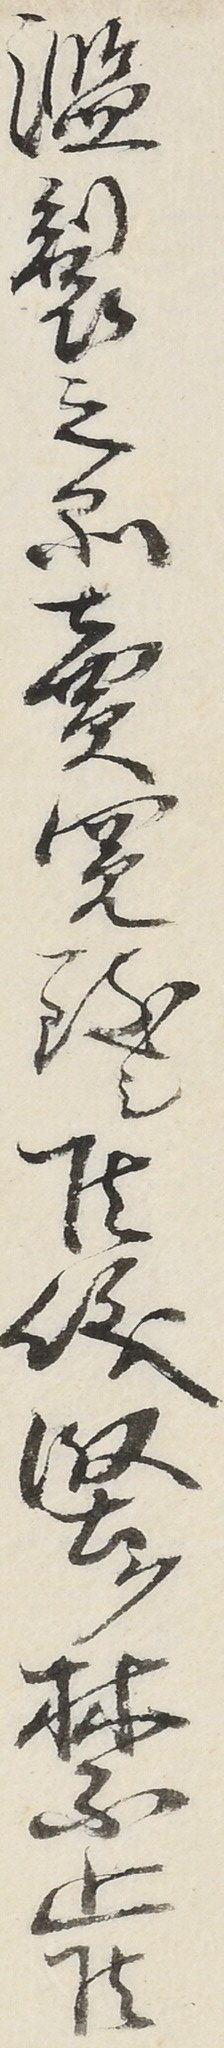濫製之品売買致シ候儀堅ク禁止候
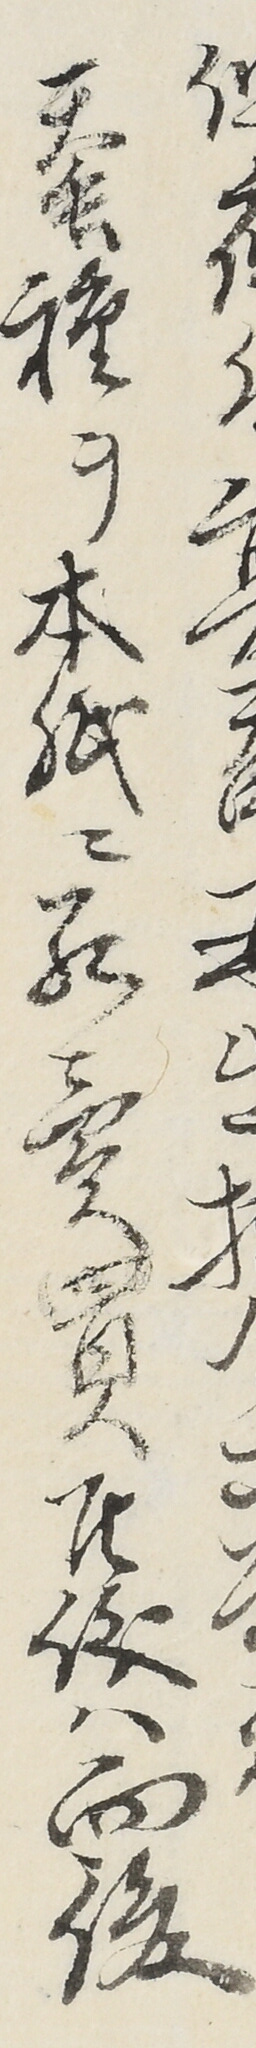蚕種ヲ本紙ニ罷売買候儀ハ向後
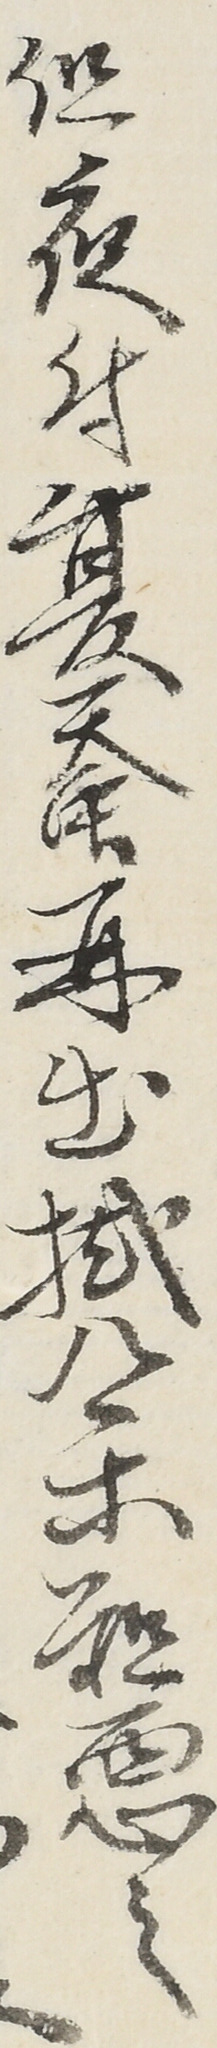但夜付夏蚕再出掛合等粗悪之
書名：廻状（控）
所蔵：伊那市立高遠町図書館・合同会社AMANE
